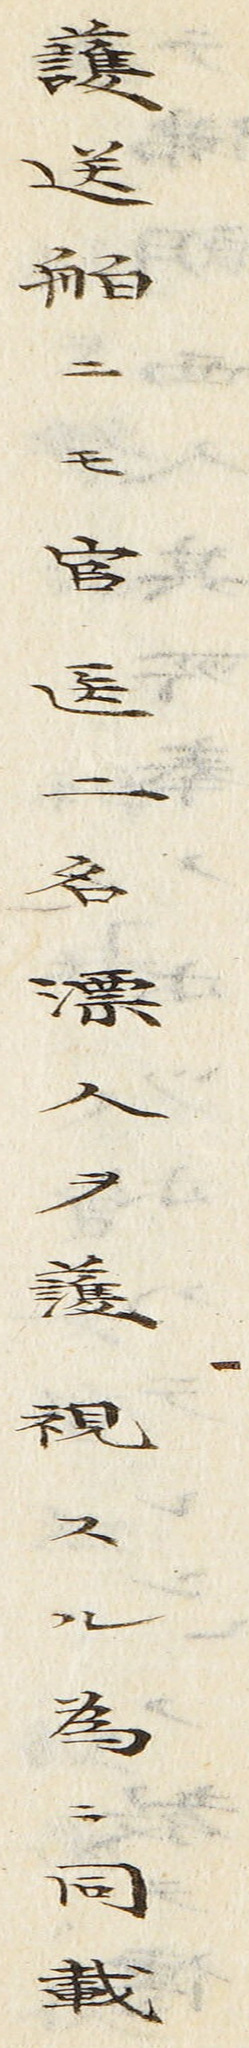護送舶ニモ官医二名漂人ヲ護視スル為ニ同載
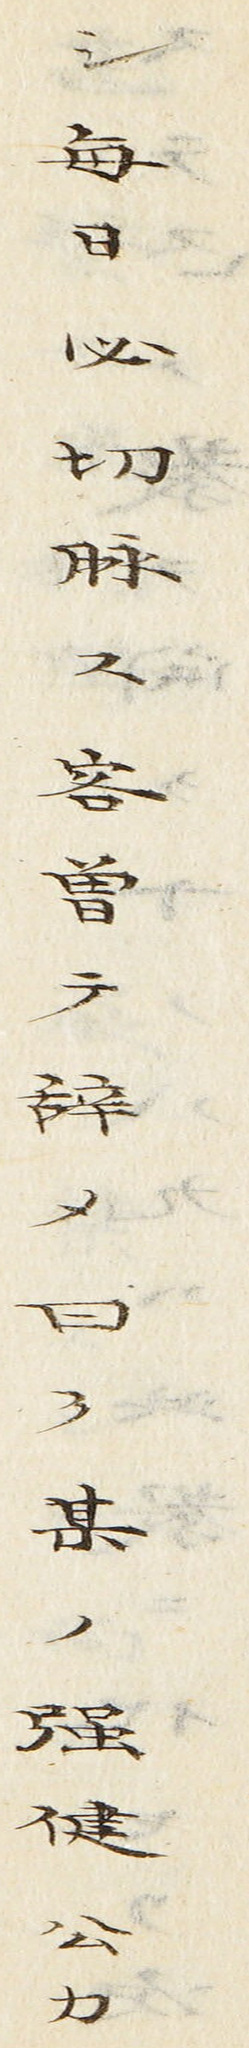シ毎日必切脉ス客曽テ辞シテ曰ク某ノ強健公カ
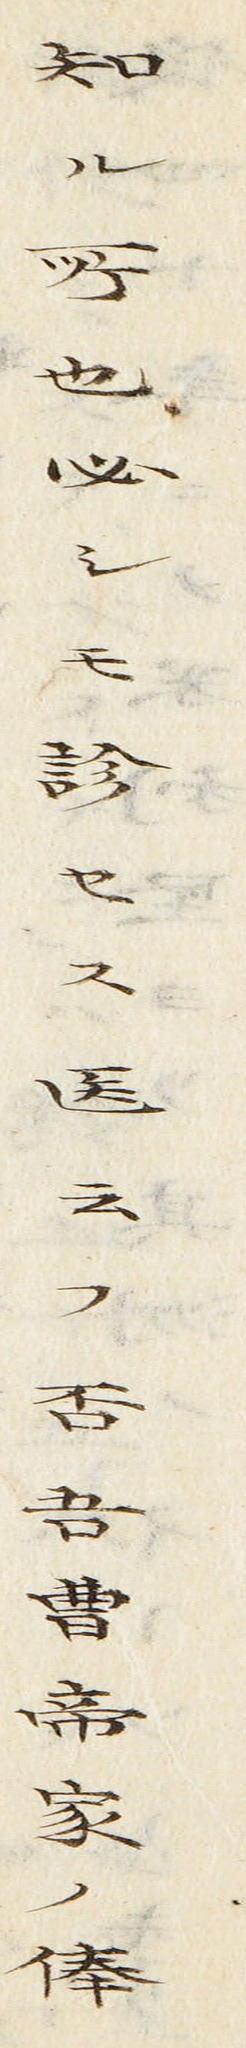知ル所也必シモ診セス医云フ否吾曹帝家ノ俸
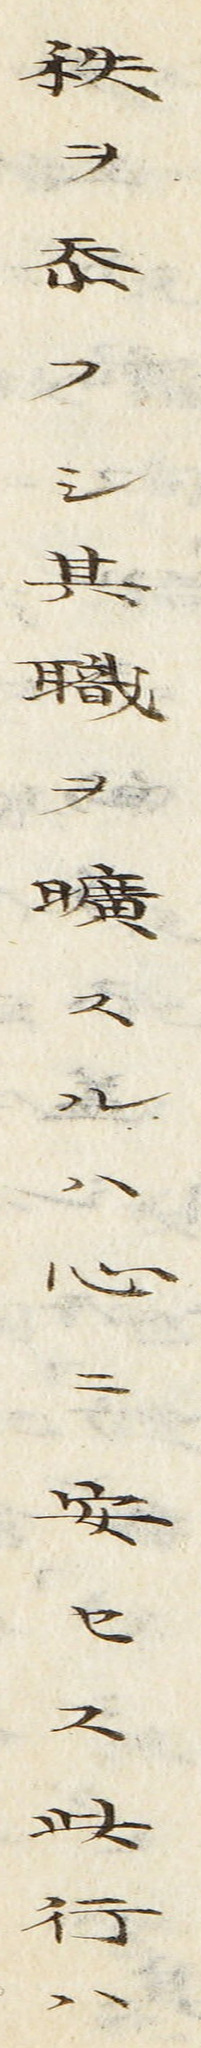秩ヲ忝フシ其職ヲ曠スルハ心ニ安セス此行ハ
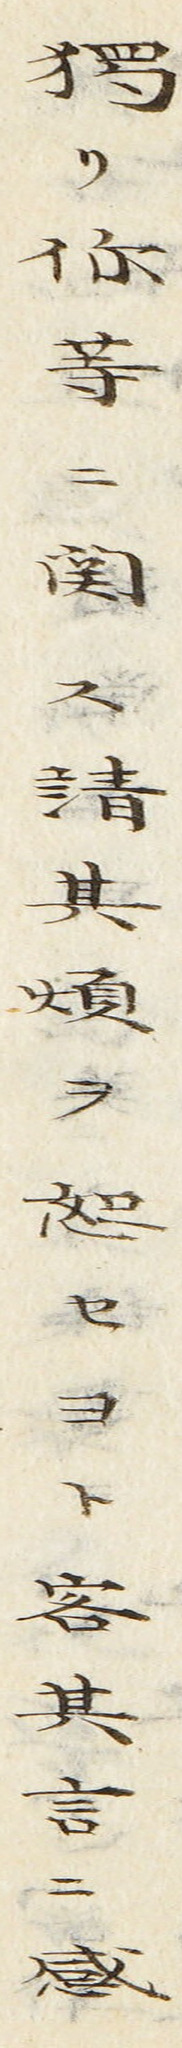独リ你等ニ関ス請其煩ヲ恕セヨト客其言ニ感
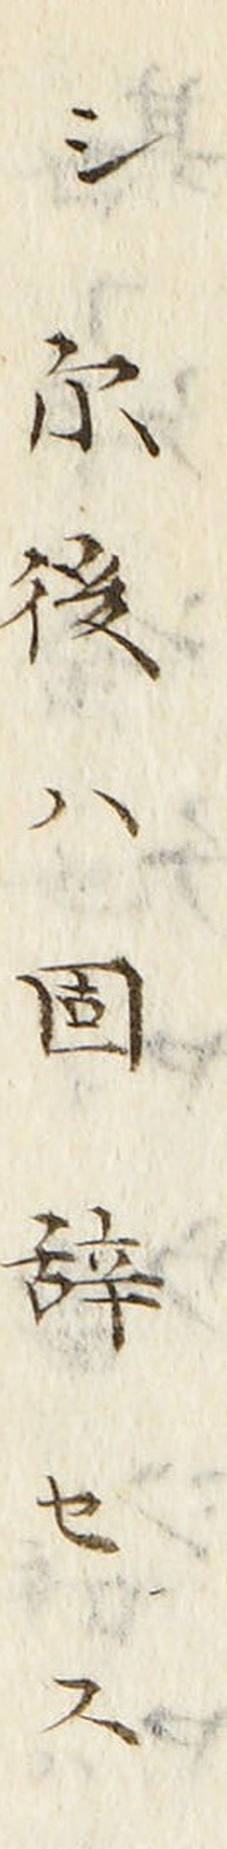シ尓後ハ固辞セス
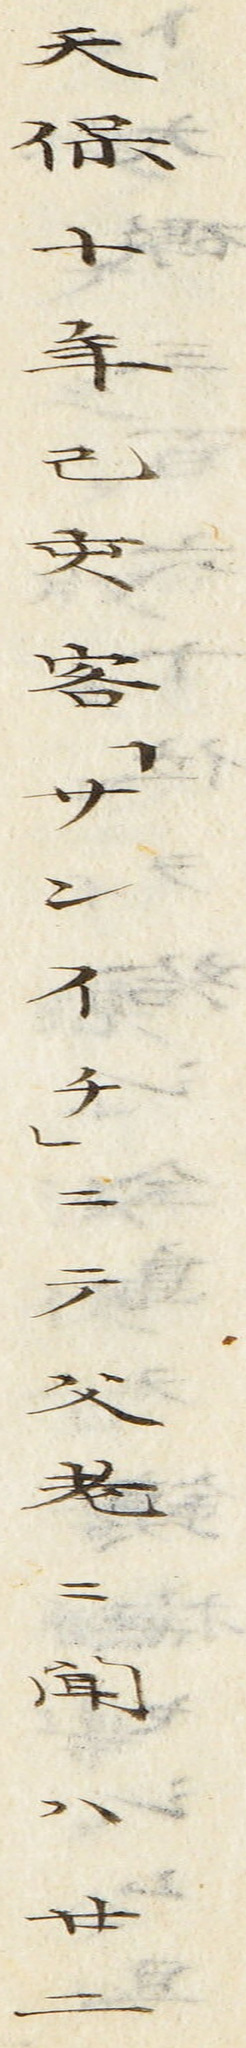天保十年己亥？客「サンイチ」ニテ父老ニ聞ハ廿ニ
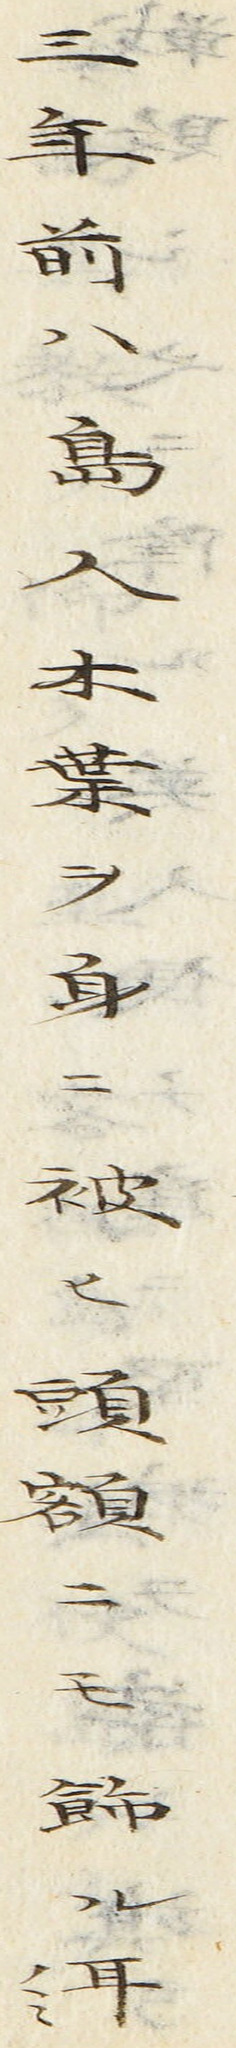三年前ハ島人木葉ヲ身ニ被ヒ頭額ニモ飾ル耳
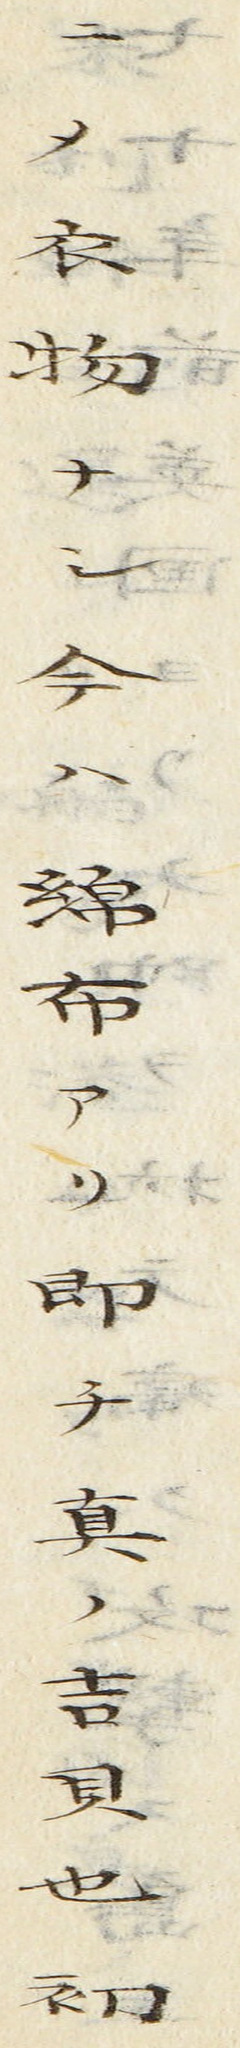ニシテ衣物ナシ今ハ綿布アリ即チ真ノ吉貝也初

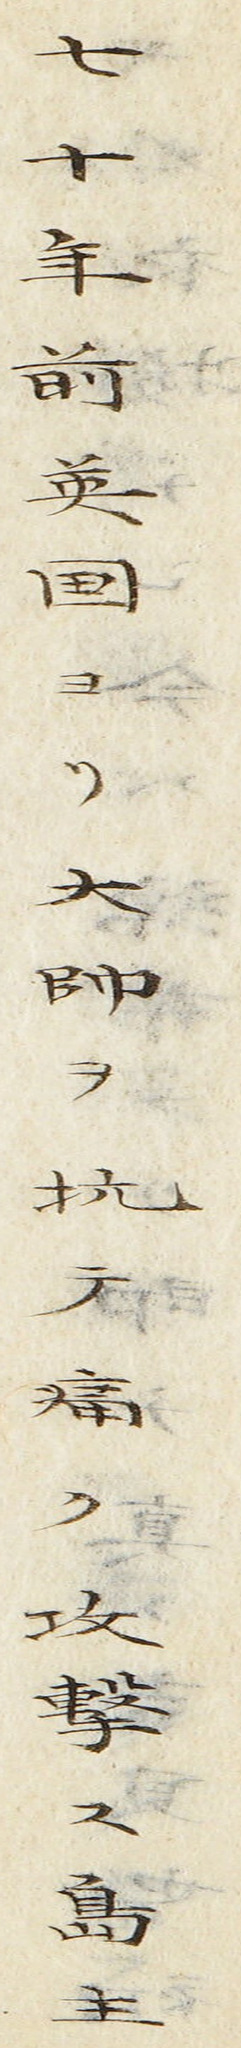七十年前英国ヨリ大帥ヲ抗テ痛ク攻撃ス島主
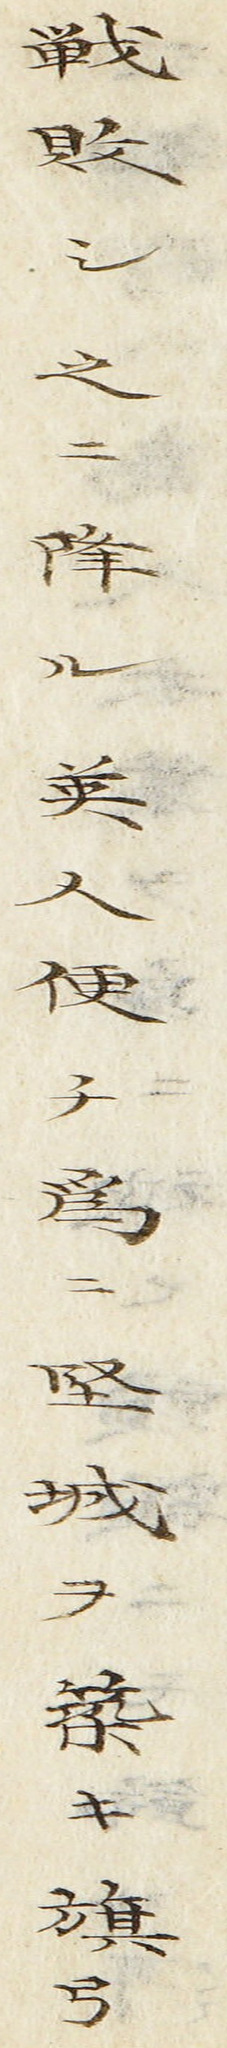戦敗シ之ニ降ル英人便チ為ニ堅城ヲ築キ旗弓
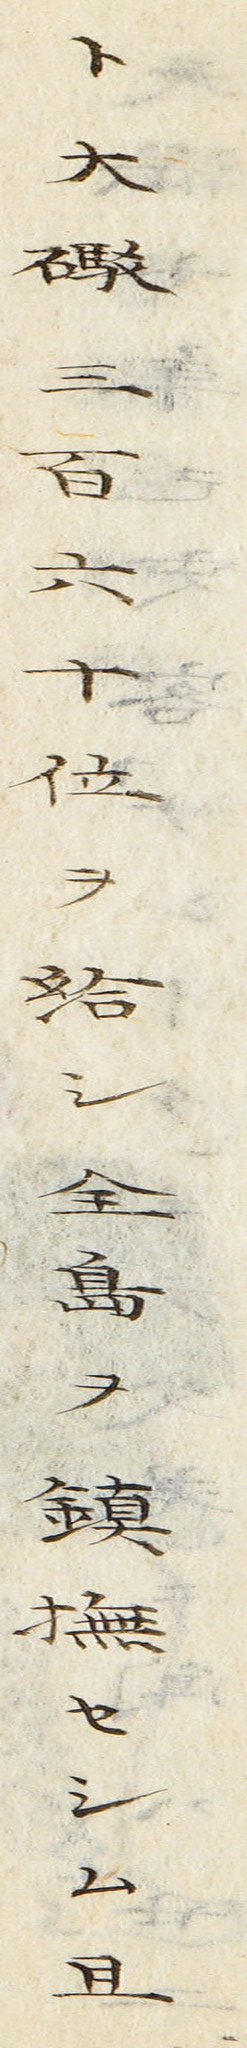ト大礟三百六十位ヲ給シ全島ヲ鎮撫セシム且
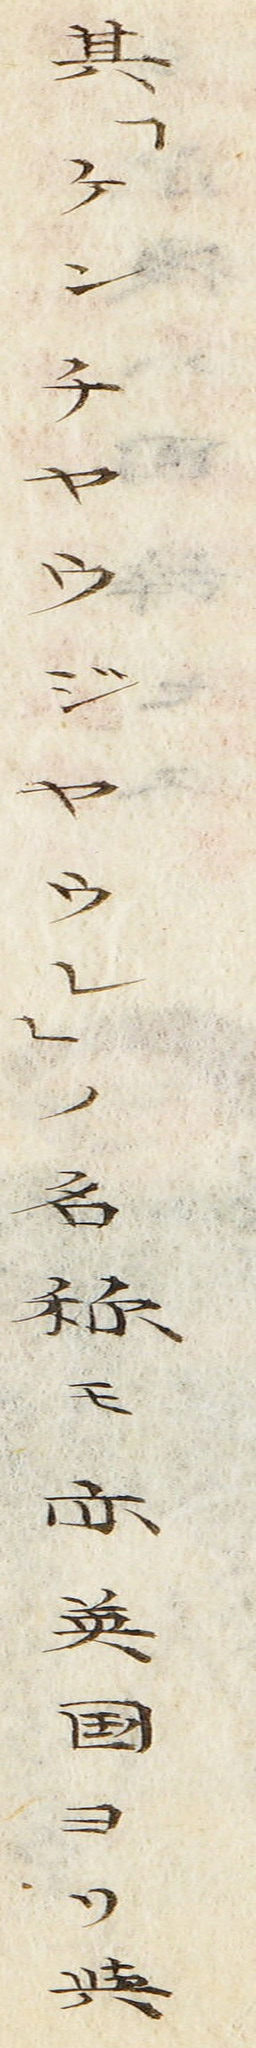其「ケンチヤウジヤウレ」ノ名称モ亦英国ヨリ与
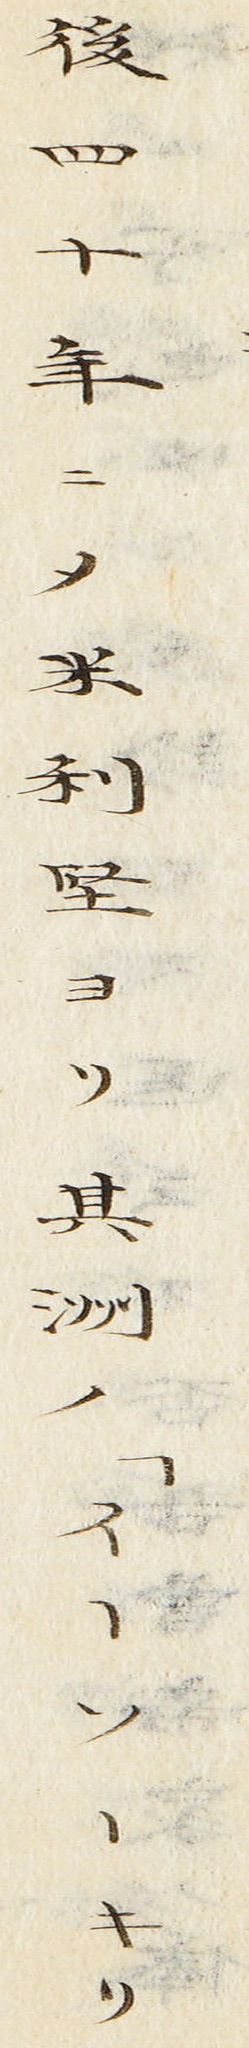後四十年ニシテ米利堅ヨリ其洲ノ「イーソーキリ
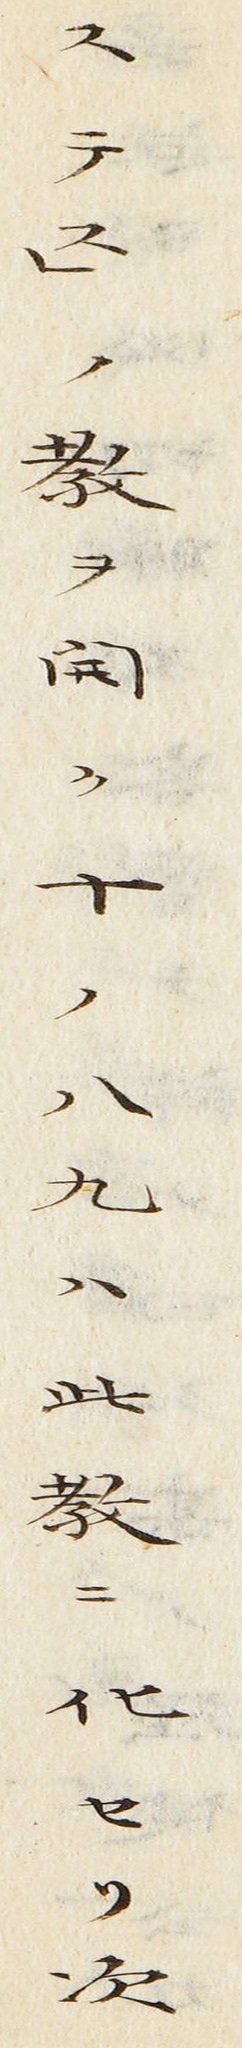ステス」ノ教ヲ開ク十ノ八九ハ此教ニ化セリ次
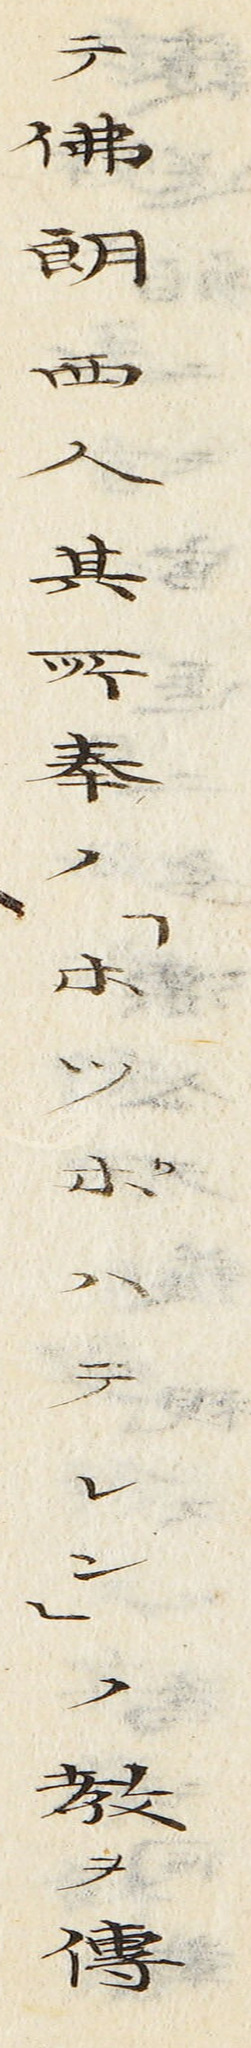テ仏朗西人其所奉ノ「ホツポハテレン」ノ教ヲ伝
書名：蕃談
